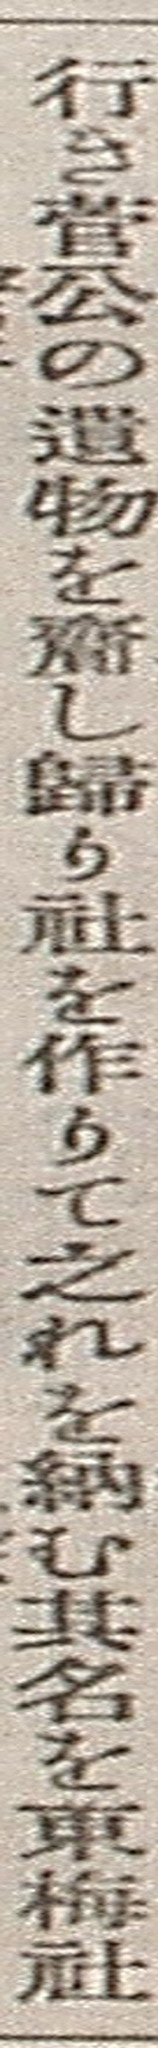行き菅公の遺物を齎し帰り社を作りて之れを納む其名を東梅社
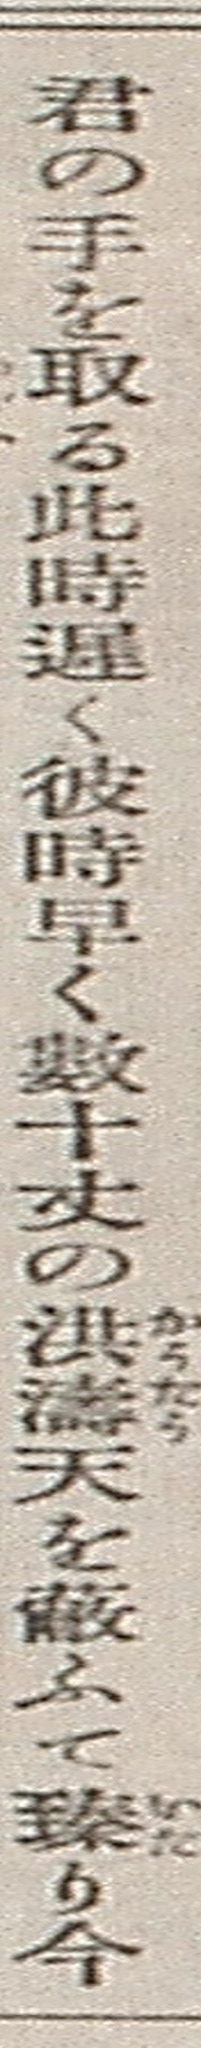君の手を取る此時遅く彼時早く数十丈の洪濤天を蔽ふて臻り今
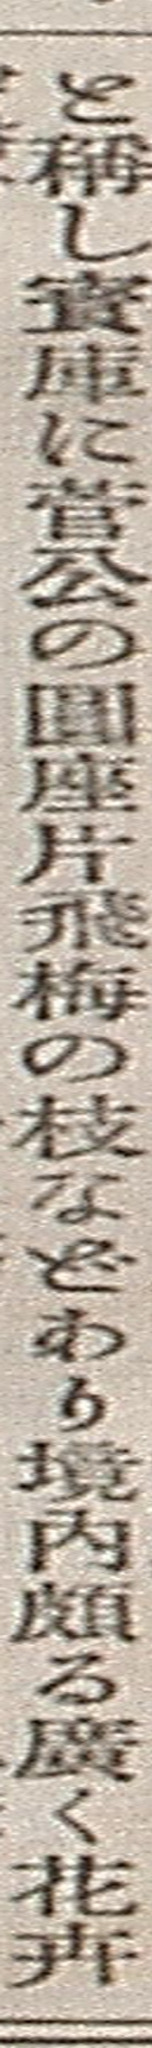と称し宝庫に菅公の円座片飛梅の枝などあり境内頗る広く花卉
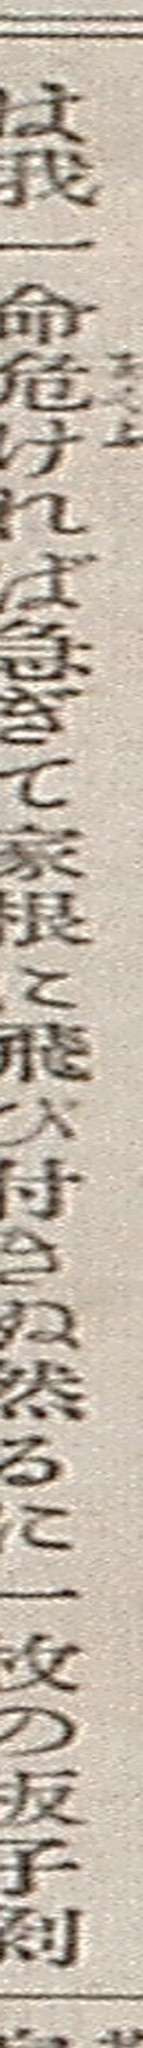は我一命危ければ急ぎて家根に飛び付きぬ然るに一枚の板子剥
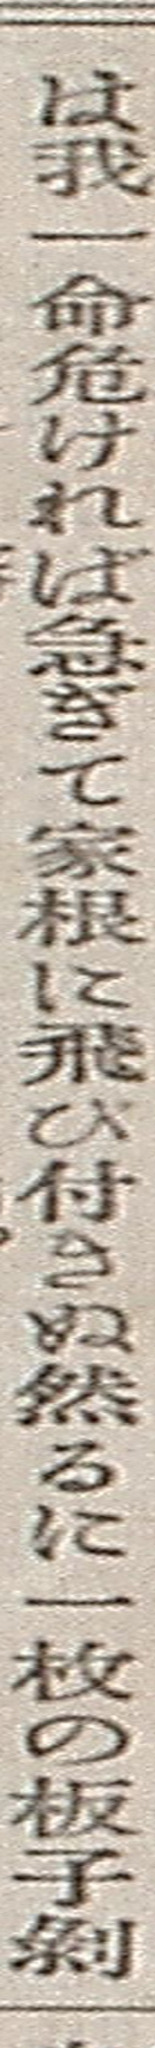は我一命危ければ急ぎて家根に飛び付きぬ然るに一枚の板子剥
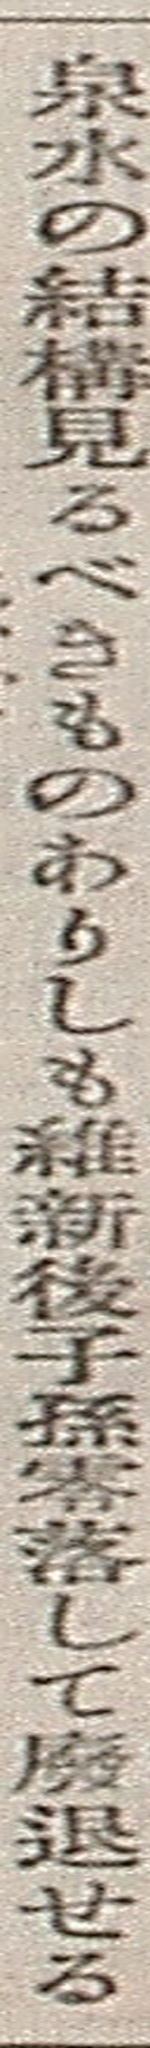泉水の結構見るべきものありしも維新後子孫零落して廃退せる
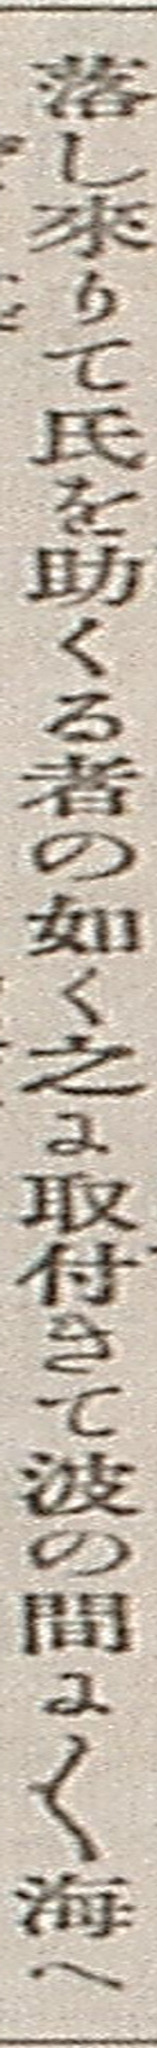落し来りて氏を助くる者の如く之に取付きて波の間に海へ
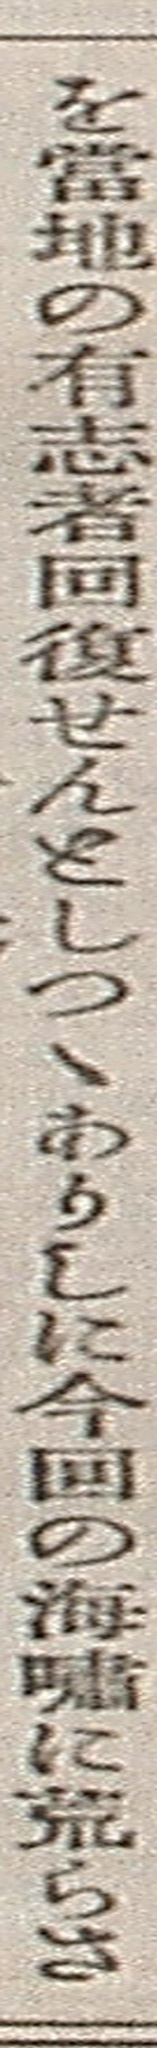を当地の有志者回復せんとしつゝありしに今回の海嘯に荒らさ
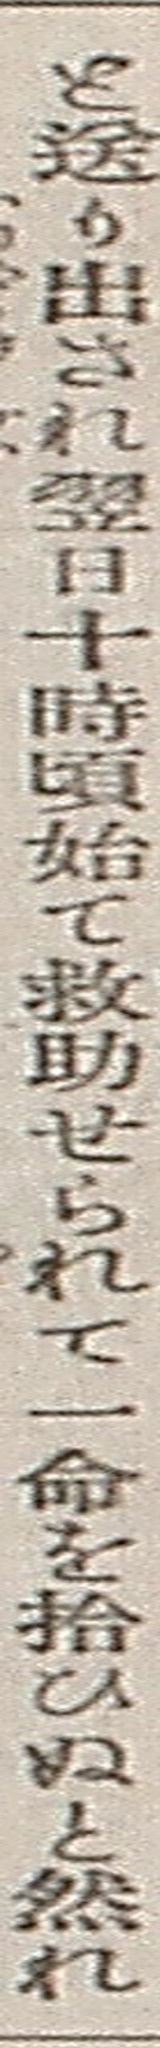と送り出され翌日十時頃始て救助せられて一命を拾ひぬと然れ
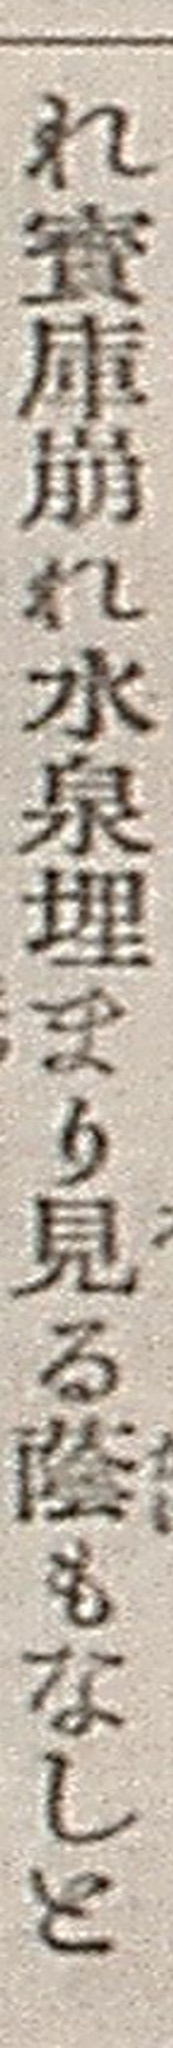れ宝庫崩れ水泉埋まり見る陰もなしと
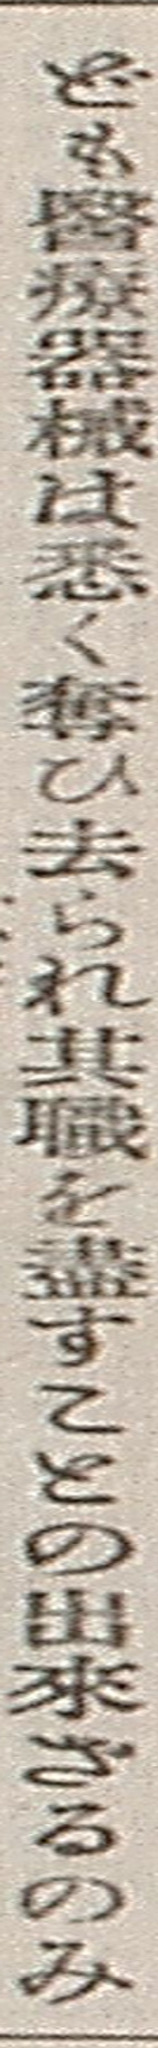ども医療器械は悉く奪ひ去られ其職を尽すことの出来ざるのみ
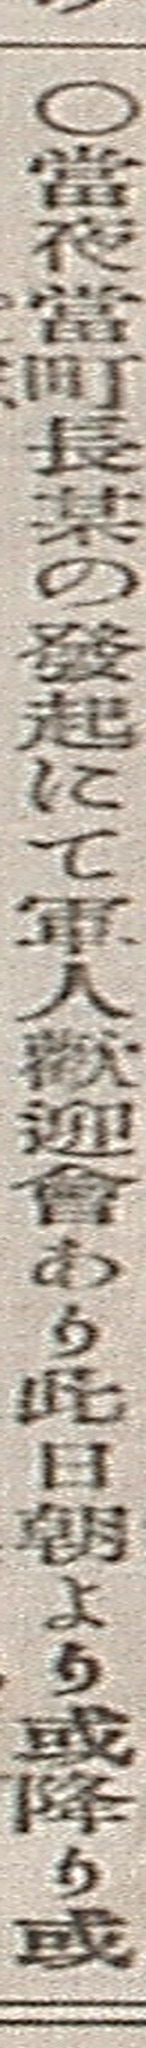○当夜当町長某の発起にて軍人歓迎会あり此日朝より或降り或
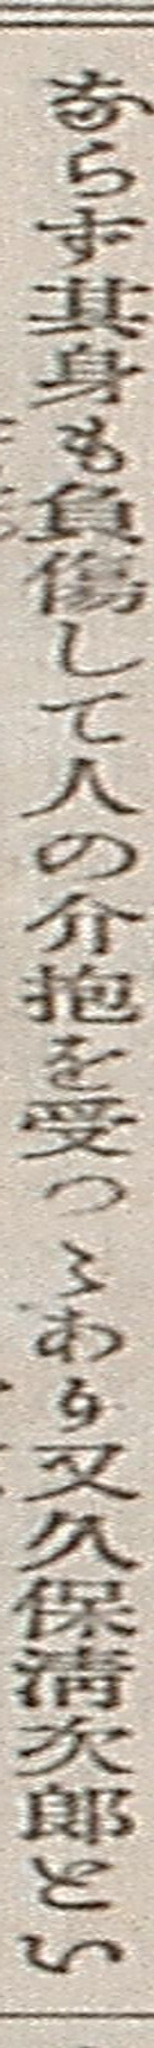ならず其身も負傷して人の介抱を受つ〻あり又久保清次郎とい
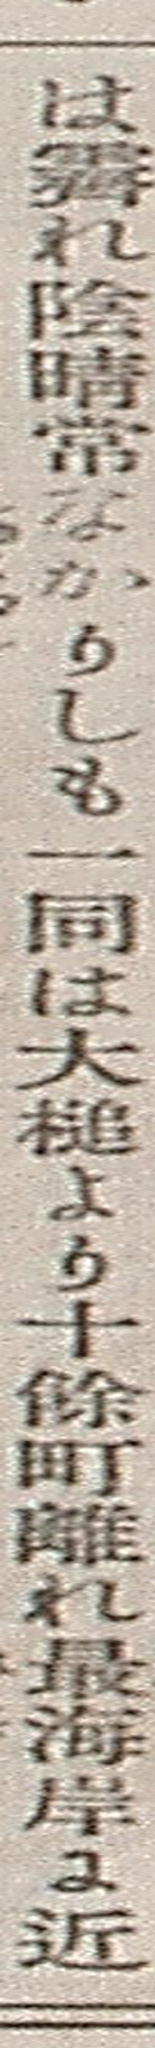は霽れ陰晴常なかりしも一同は大槌より十余町離れ最海岸に近
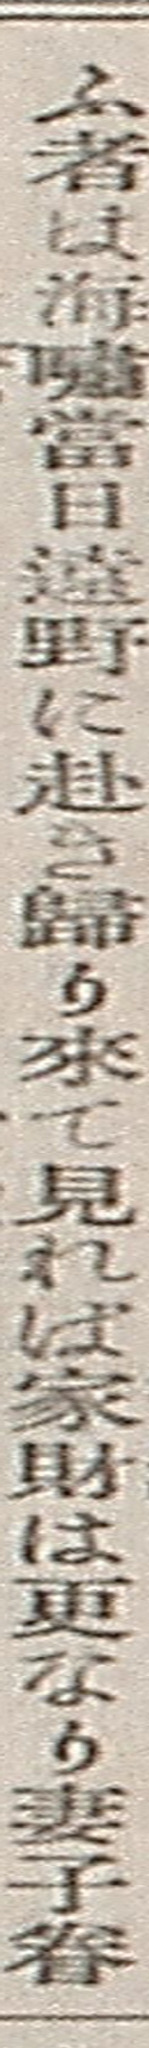ふ者は海嘯当日遠野に赴き帰り来て見れば家財は更なり妻子眷
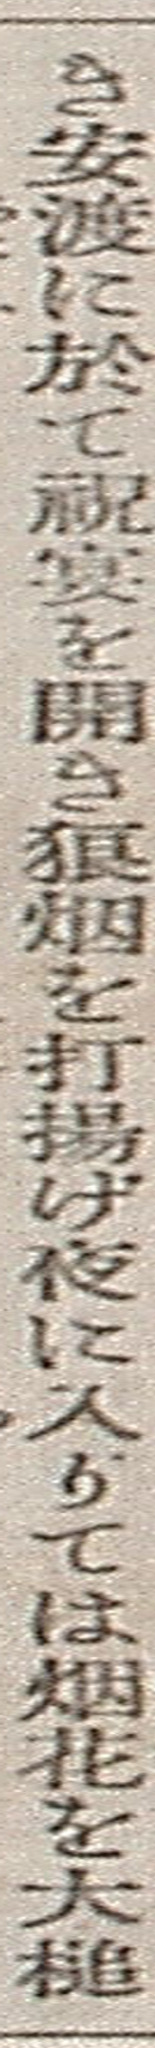き安渡に於て祝宴を開き狼烟を打揚げ夜に入りては烟火を大槌
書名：風俗畫報臨時増刊第百十九號　大海嘯被害録（中）
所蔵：東京大学地震研究所図書室 Earthquake Research Institute Library, The University of Tokyo, JAPAN
